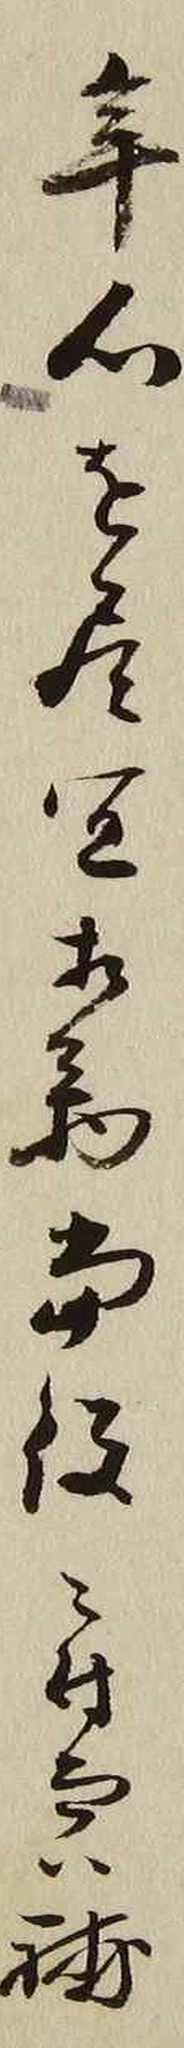年心を尽宜相勤当役に付而は補
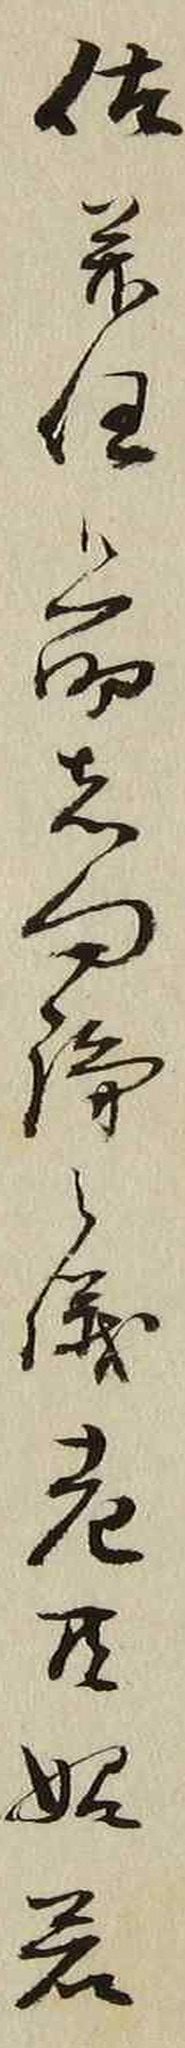佐并任候筋は勿論之儀老共始若
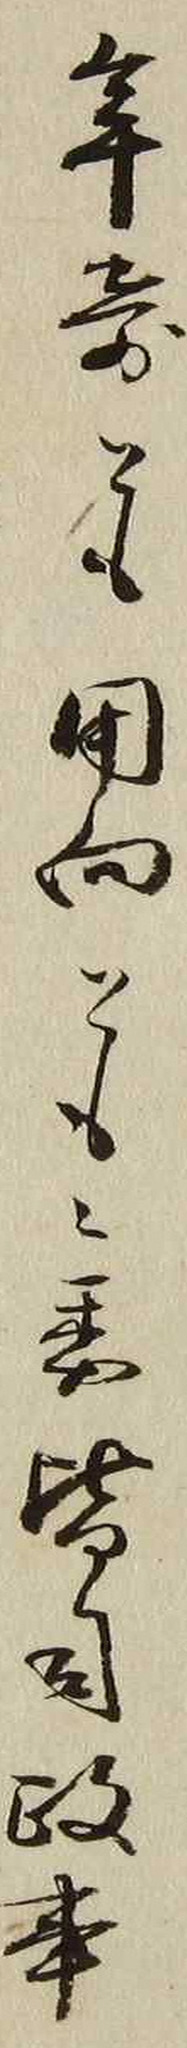年寄とも用向ともに悉皆司改事
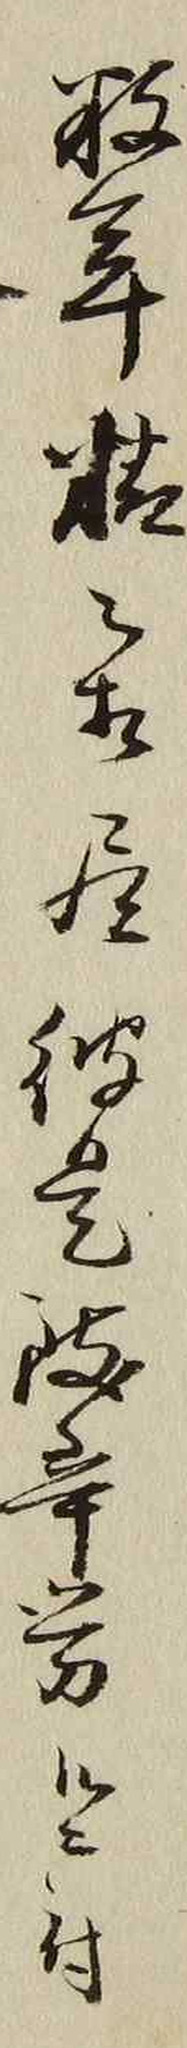数年精々相尽彼是致辛労候に付
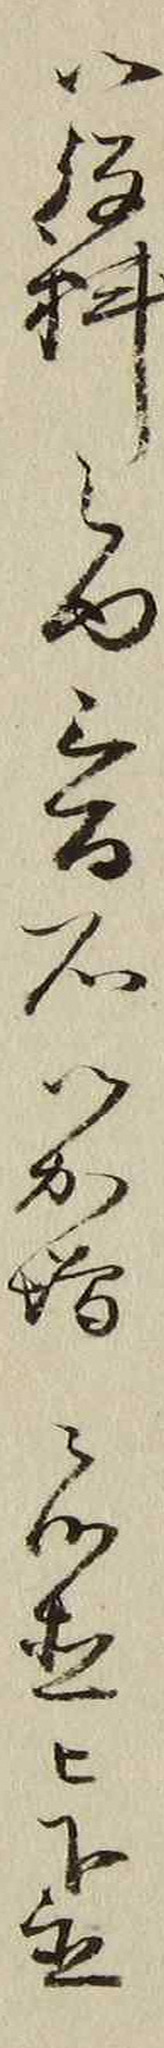御役料之内三百石御加増に御直被下置
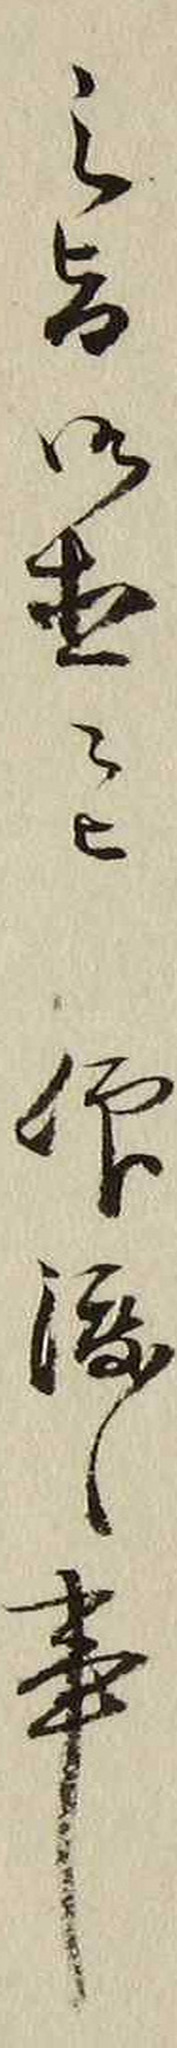之旨御直に被仰渡候事
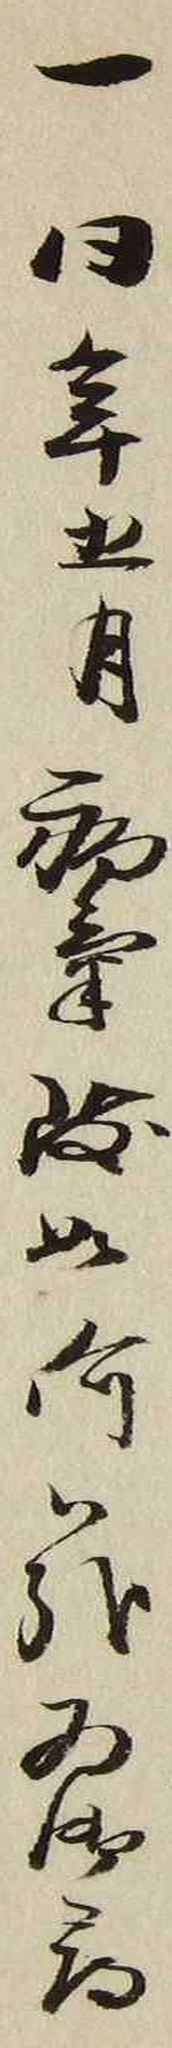一同年五月病気致如何候哉為御尋
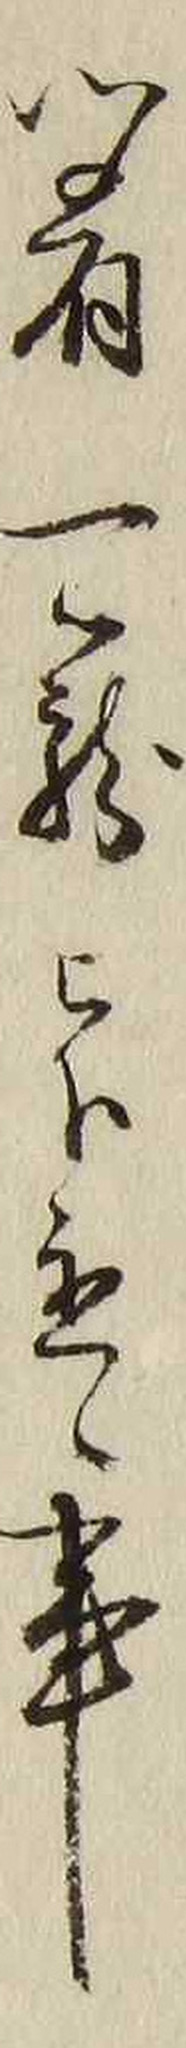御肴一籠被下置候事
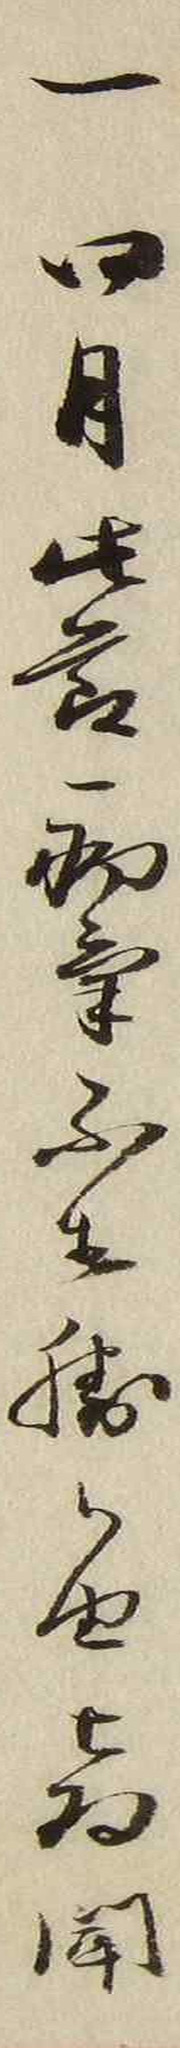一四月此節病気不相勝候由被為聞

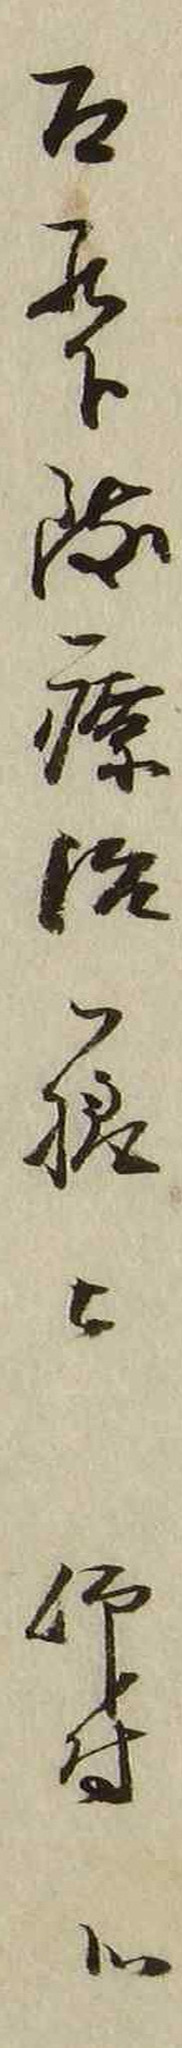召罷下致療治候様被仰付候
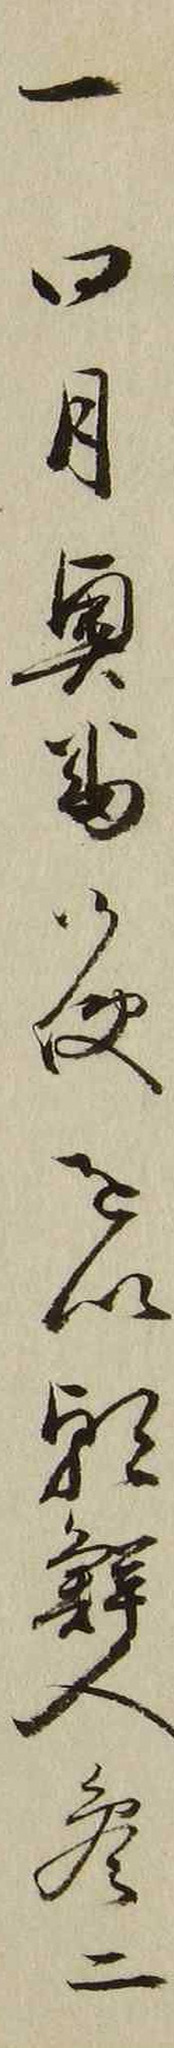一同月奥番御使を以朝鮮人参二
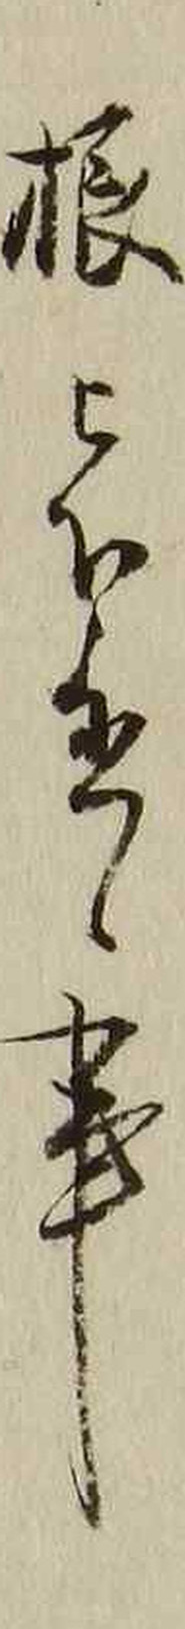殿様被下置候事
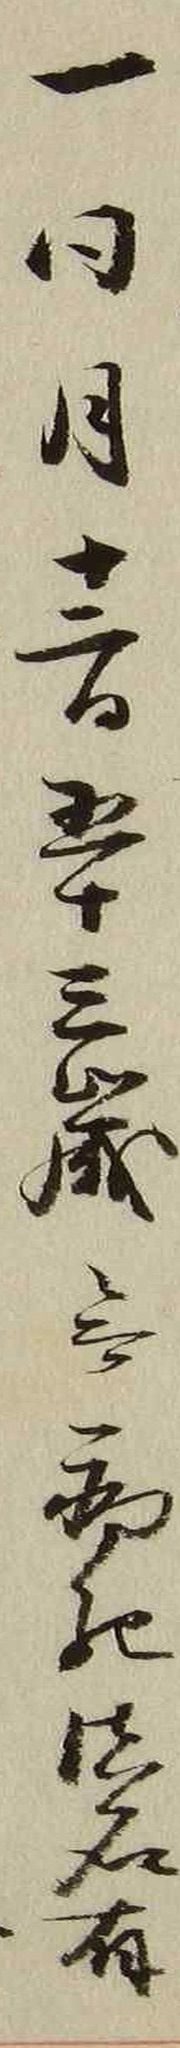一同月十二日五十三歳に而病死法名有
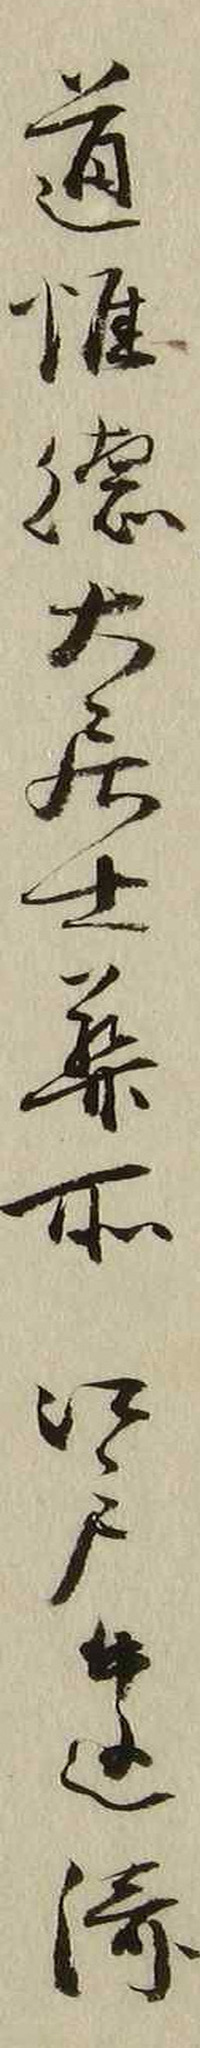道惟徳大居士葬所江戸牛込済
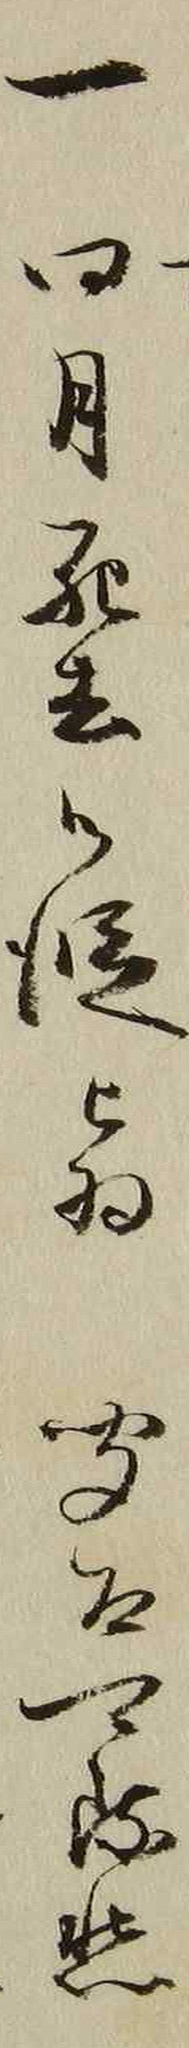一同月死去候後被為聞召可致愁
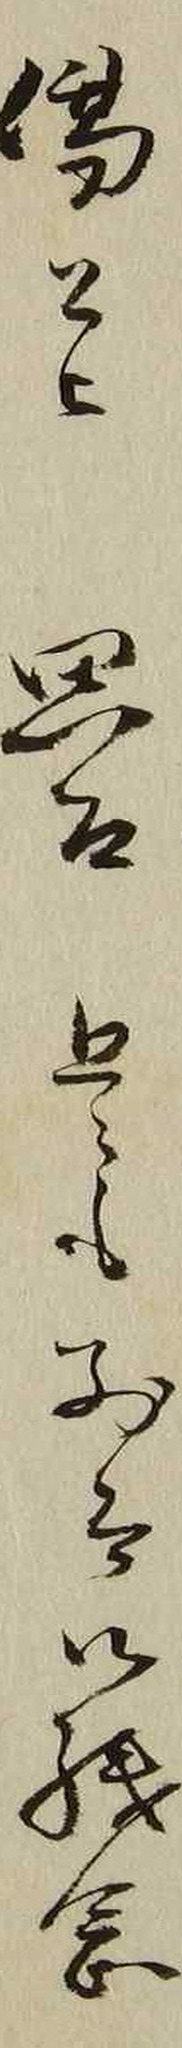傷上被思召上にも別而御残念
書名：諸士系譜　巻之292　き之部1
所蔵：会津若松市立会津図書館
